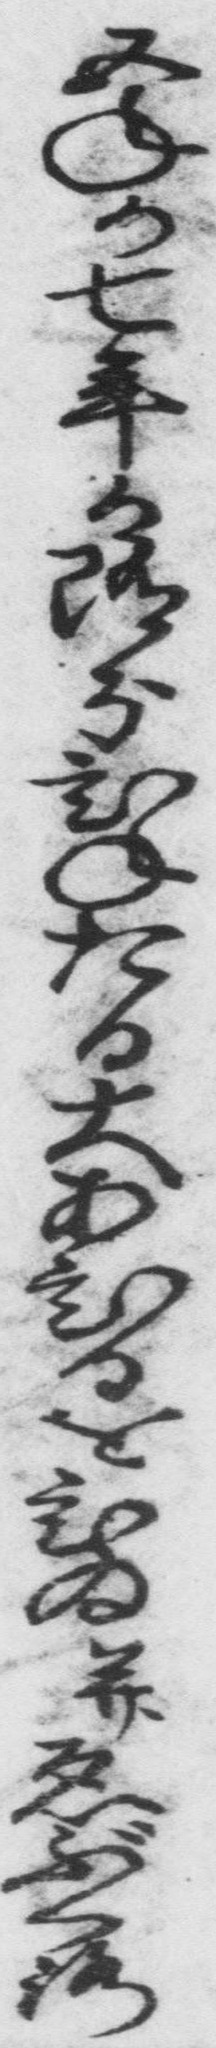五年か七年か随分ひねたる大あひるをひゐ并ゑぶくろ
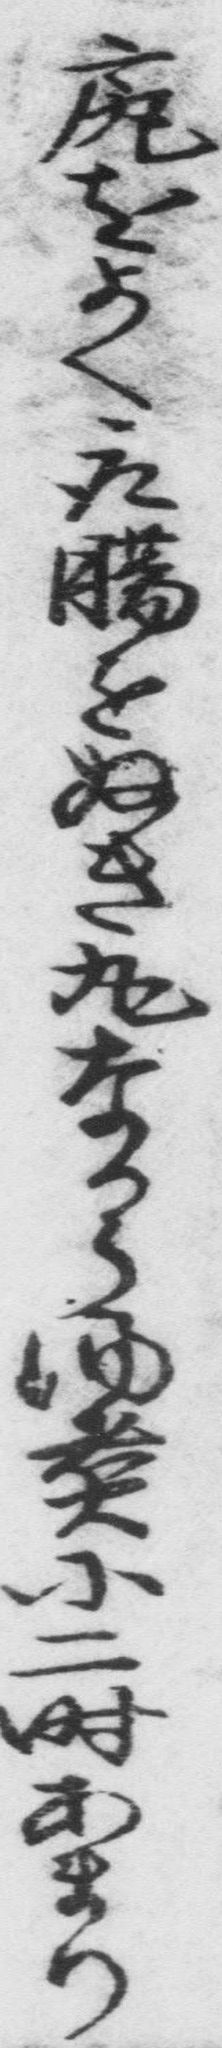尻をよく取腸をぬき丸なからゆ煮に二時あまり
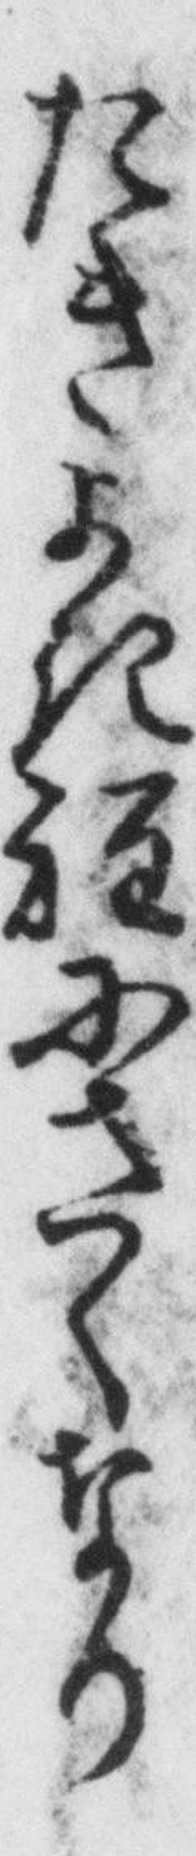たきよき程にさくなり
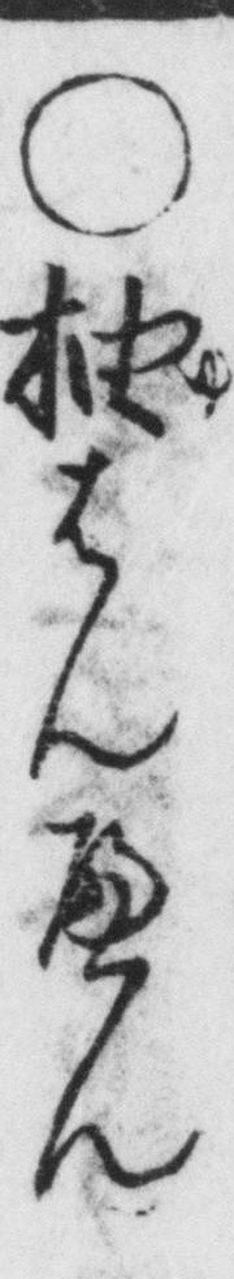〇柚はんへん
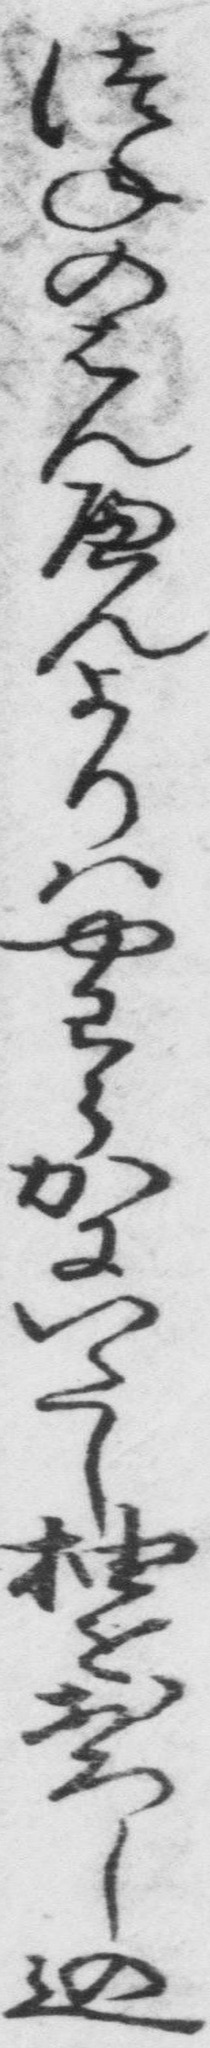つねのはんへんよりはやわらかにいたし柚をおろし込
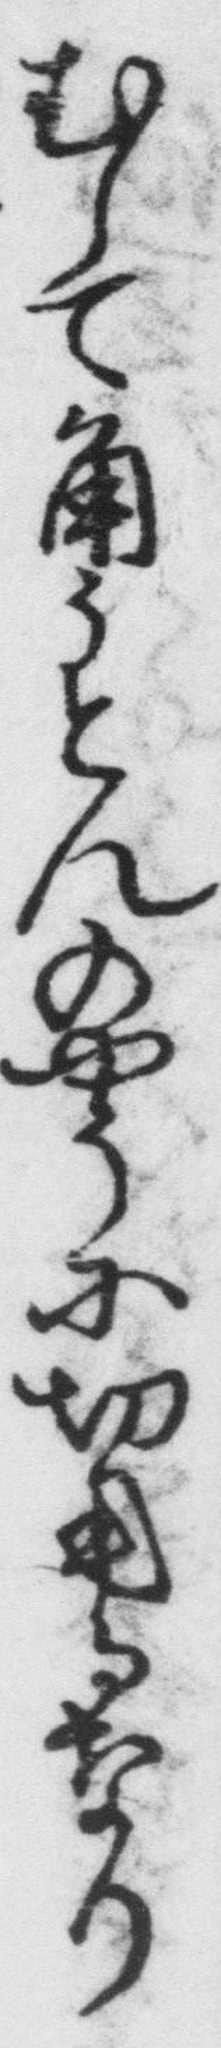むして角うとんのやうに切用るなり
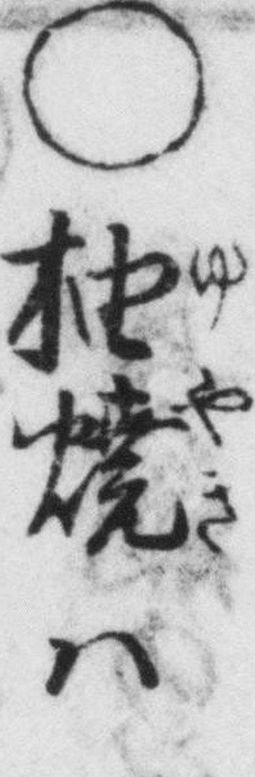〇柚焼は
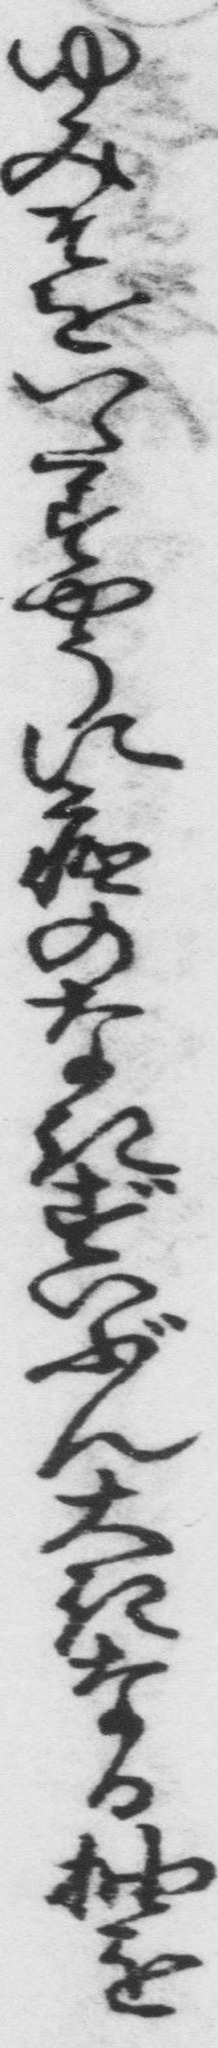ゆみそをいたすやうに疵のなきずいぶん大きなる柚を
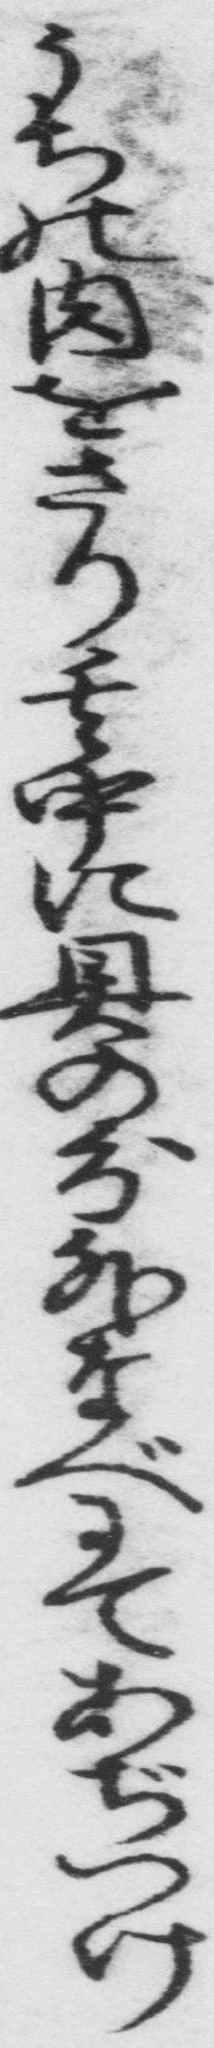うちの肉をさり其中に具の分外なべにてあぢつけ
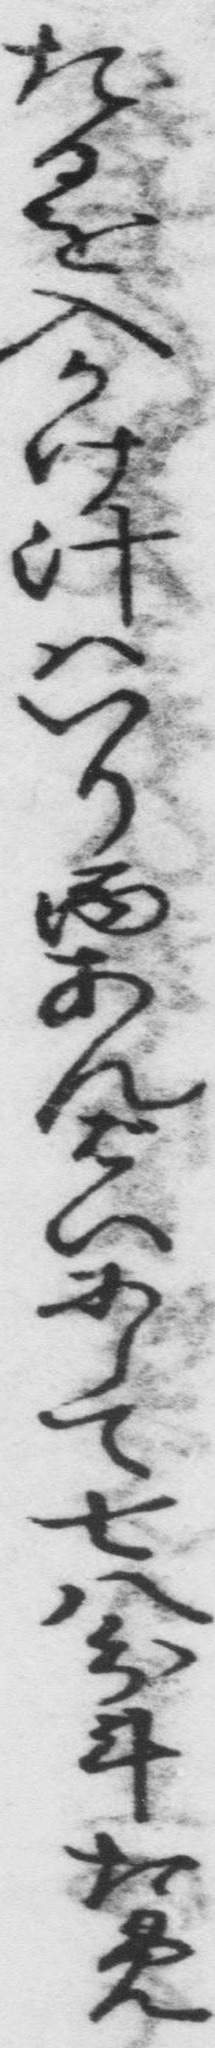たるを入かけ汁はいり酒あんばいにして七八分斗ため
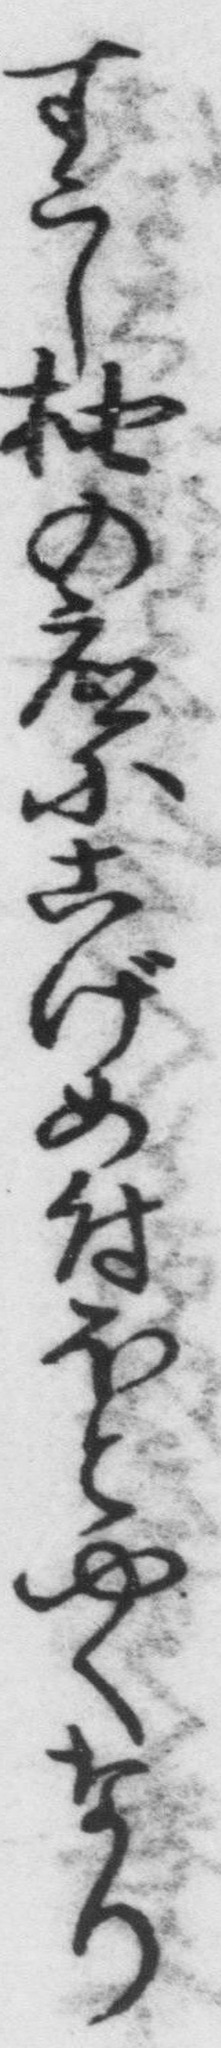すこし柚の底にこげめ付ほとやくなり
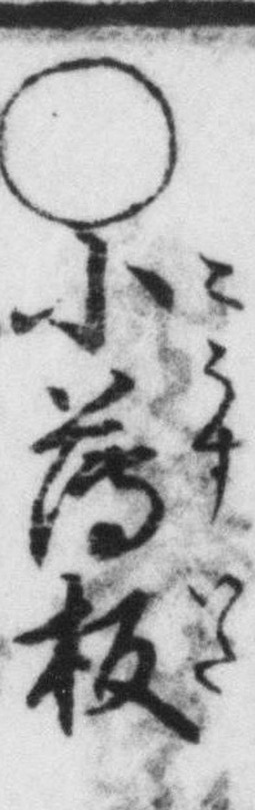〇小薄板
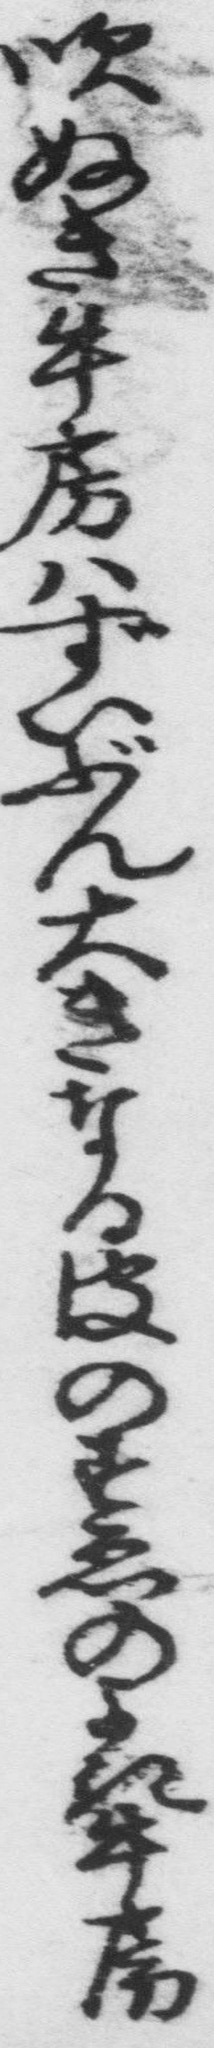吹ぬき午房はずいぶん大きなる皮のすゑのよき午房
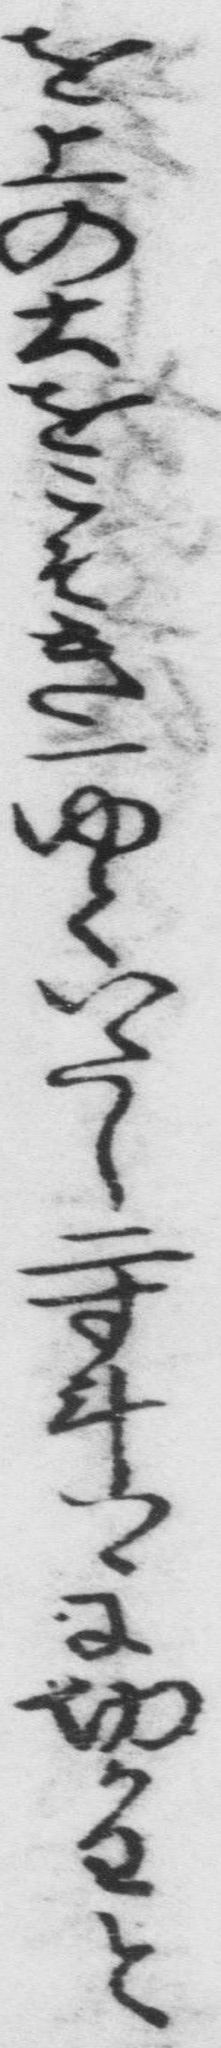を上の土をこそき一ゆていたし二寸斗つゝに切かわと
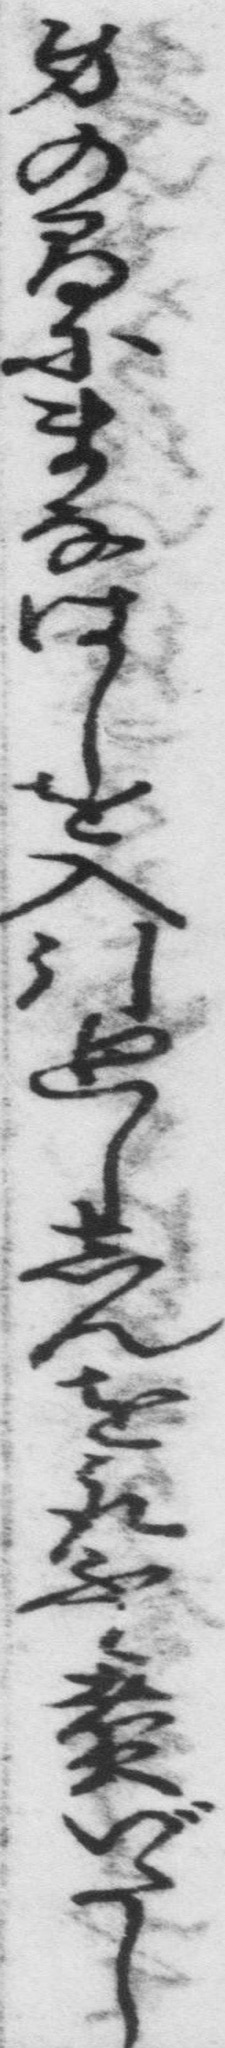身の間にまなはしを入引廻ししんを取ふ？ゝ？煮いだし

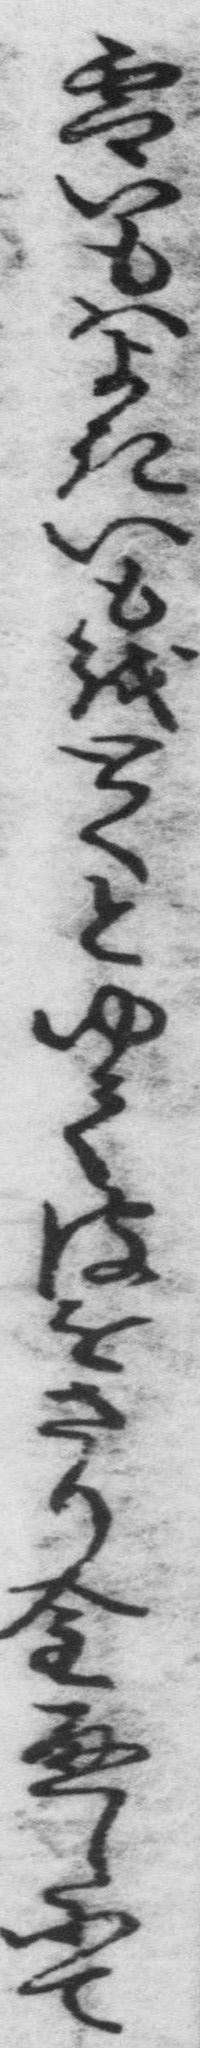雪いもはよきいもをよくとゆて皮をさり金通しにて
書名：卓子料理仕様
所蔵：大阪府立大学学術情報センター 国文学研究資料館
